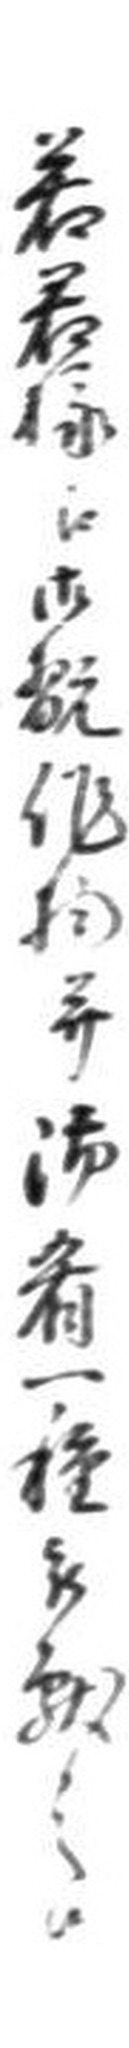若君様江御翫作物并御肴一種被献之候
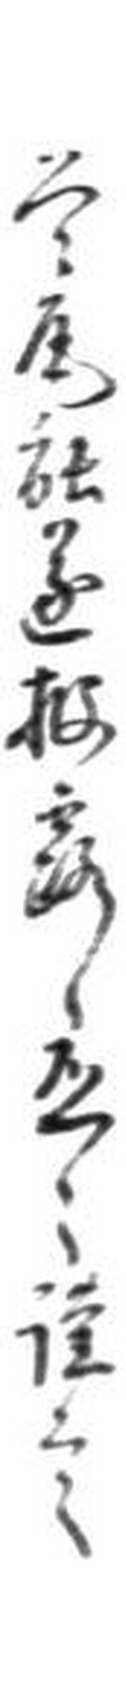首尾能遂披露候恐々謹言
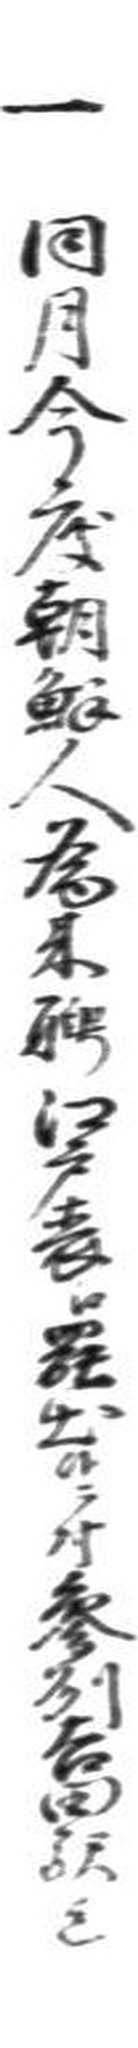一同月今度朝鮮人為来聘江戸表江罷出候ニ付参州吉田駅迄

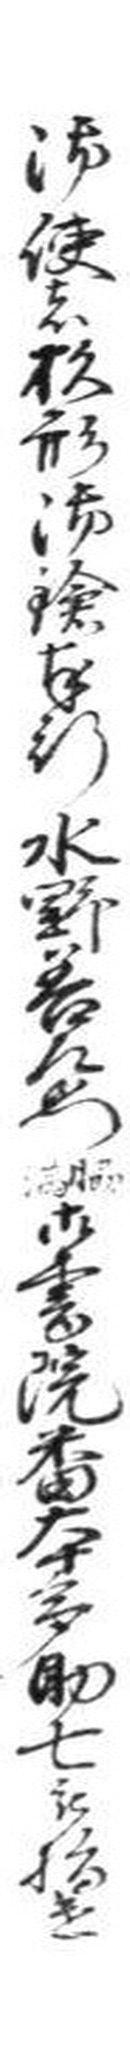御使者杉形御鎗奉行水野善左衛門脇満御書院番本多助七被指遣
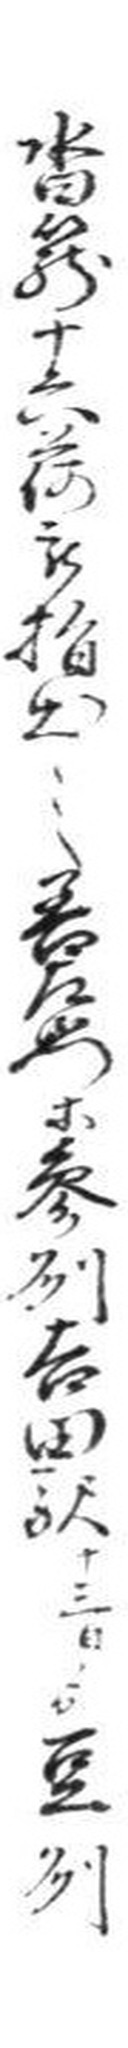沓籠十六荷被指出之善左衛門等参州吉田駅十三日ゟ豆州
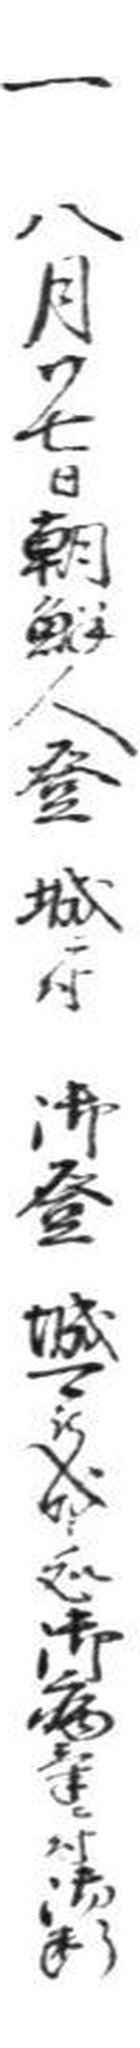一八月廿七日朝鮮人登城ニ付御登城可被成候処御病気ニ付御断
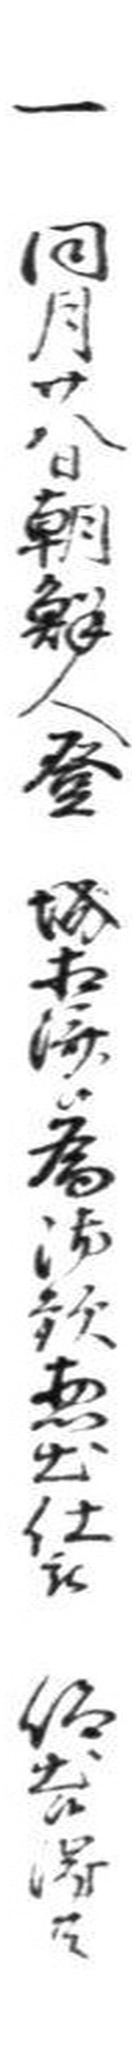一同月廿八日朝鮮人登城相済候為御歓惣出仕被仰出候得共
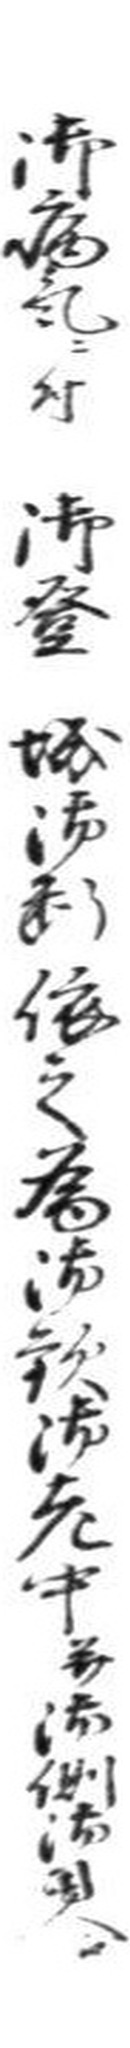御病気ニ付御登城御断依之為御歓老中并御側御用人江
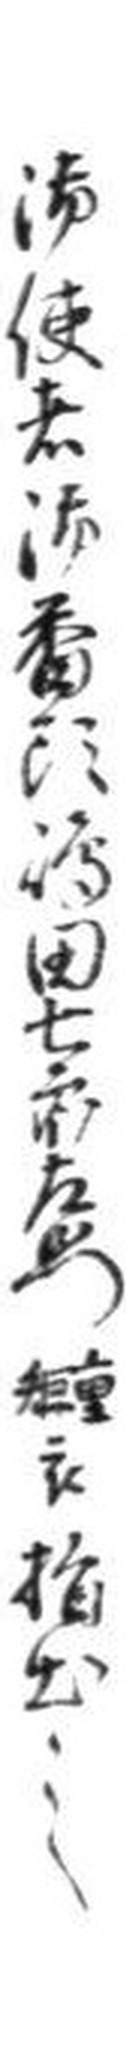御使者御番頭嶋田七郎左衛門重矩被指出之
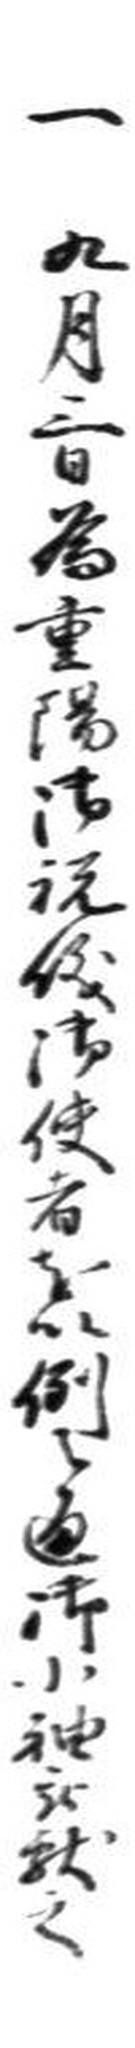一九月三日為重陽御祝儀御使者を以例之通御小袖被献之
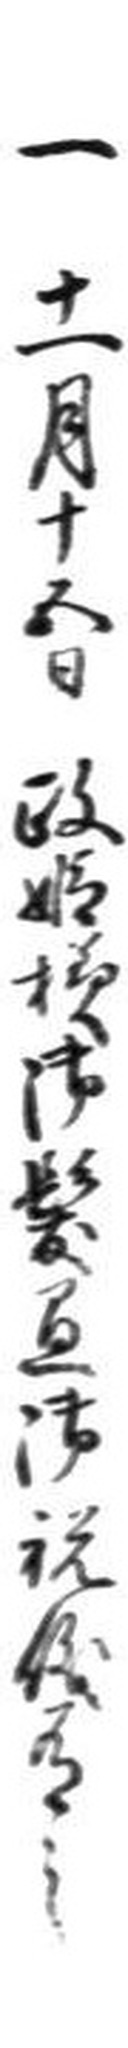一十一月十五日政姫様御髪置御祝儀有之
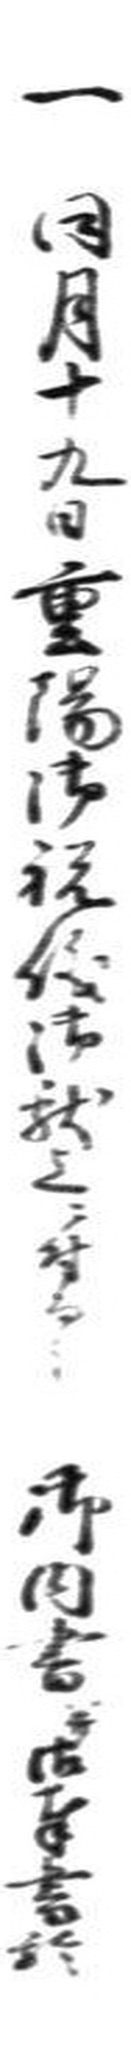一同月十九日重陽御祝儀御献上ニ付而之御内書并御奉書於
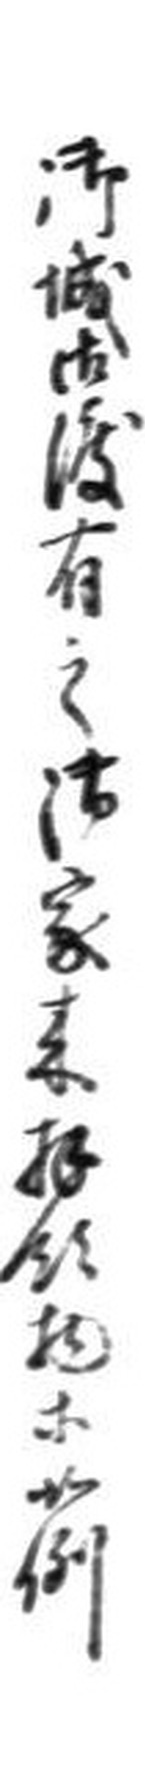御城御渡有之御家来拝領物等如例
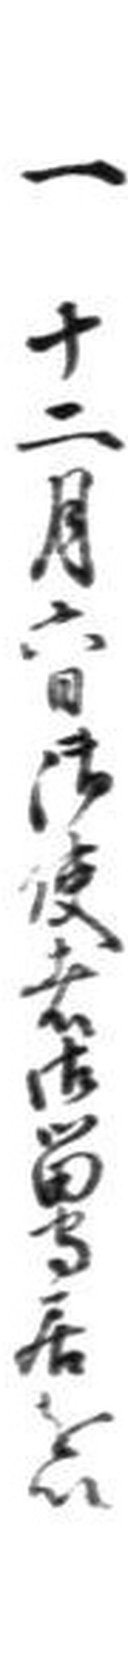一十二月六日御使者御留守居を以
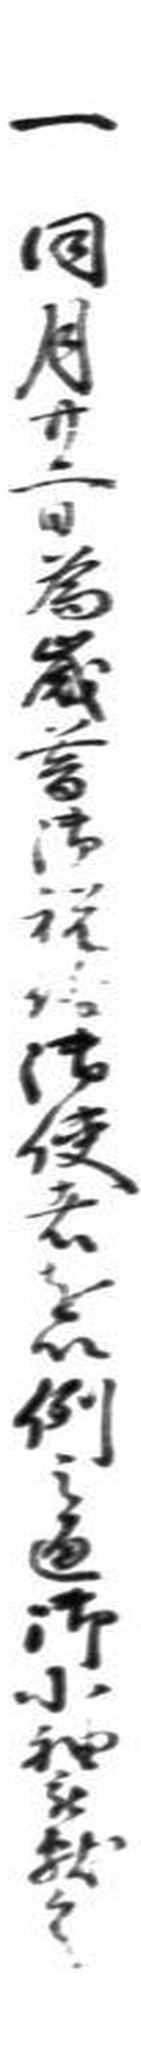一同月廿二日為歳暮御祝儀御使者を以例之通御小袖被献之

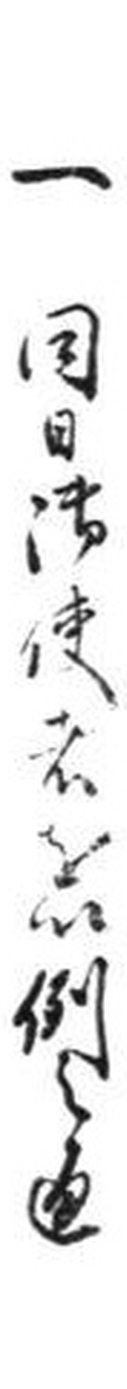一同日御使者を以例之通
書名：家譜 十五 綱昌公 従天和元年到元禄十二年
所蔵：福井県文書館 Fukui Prefectural Archives
